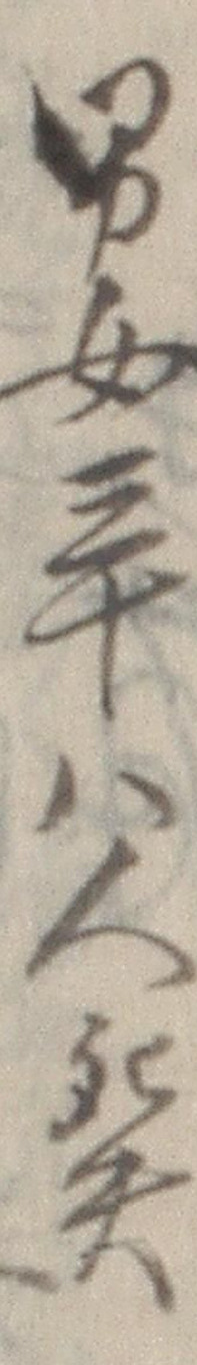男女三十八人死失
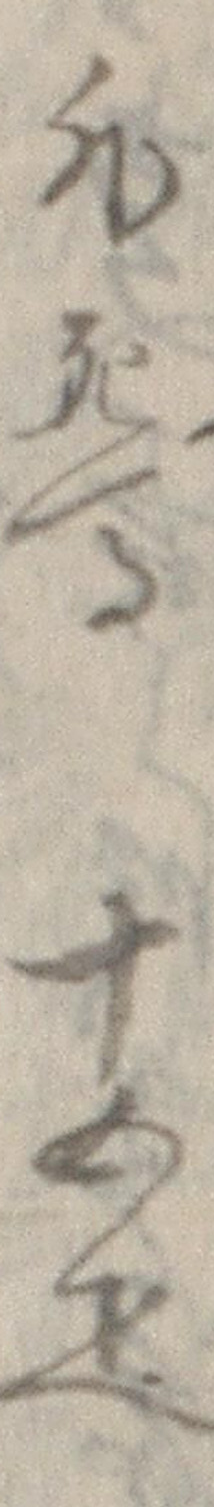外死馬十五疋
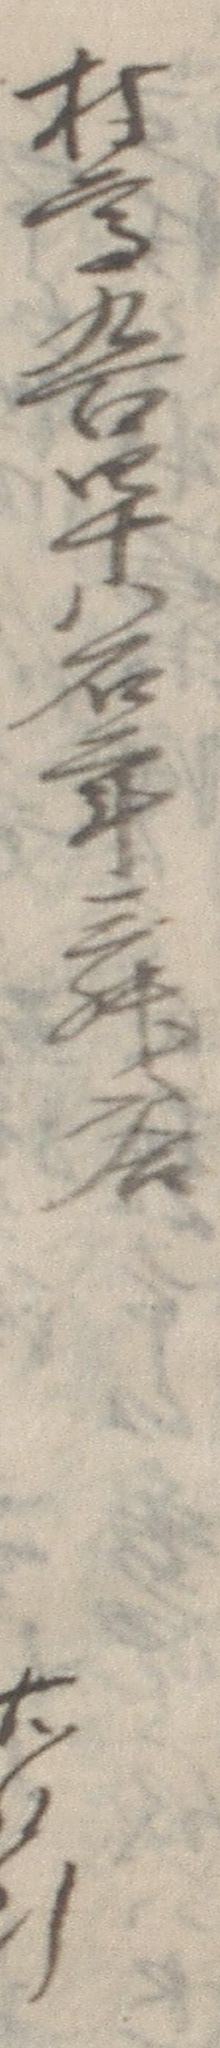村高九百四十八石二斗三升六合
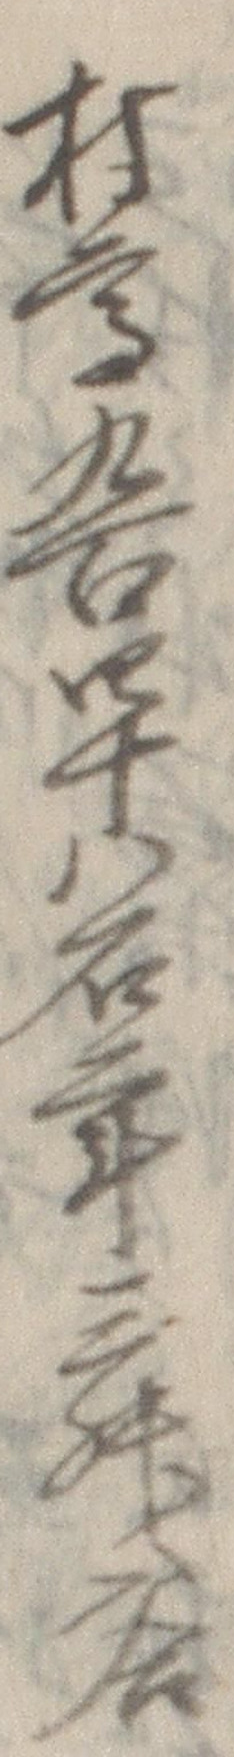村高九百四十八石二斗三升六合
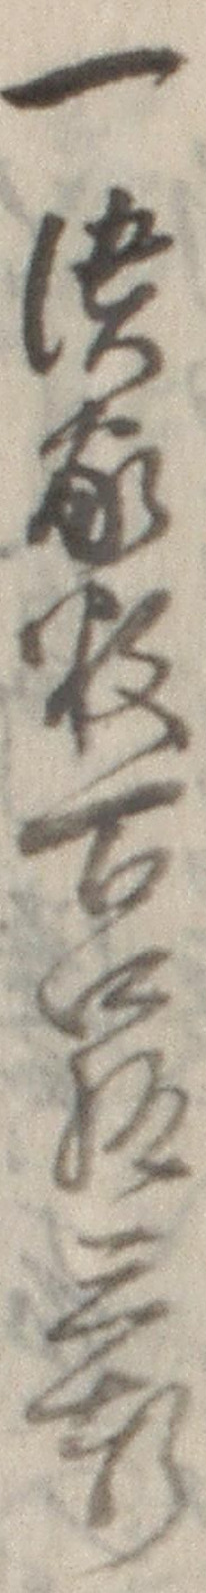一潰家数百五拾四軒
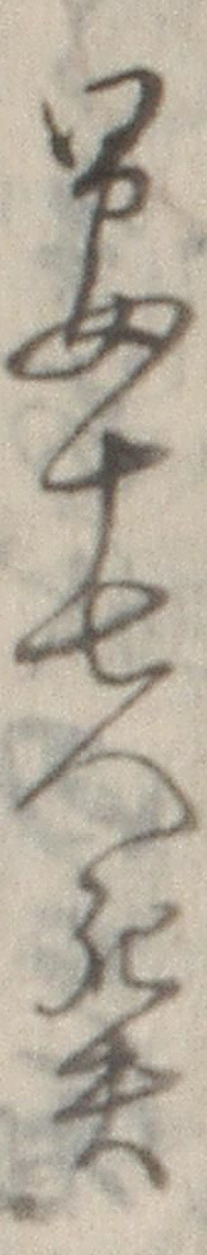男女十七人死失
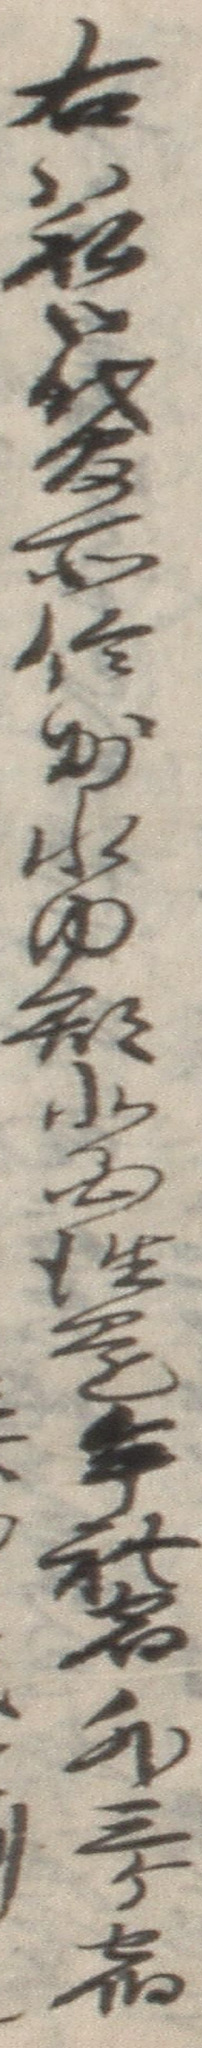右ハ私御代官所信州水内郡北国往還牟礼宿外三ヶ宿
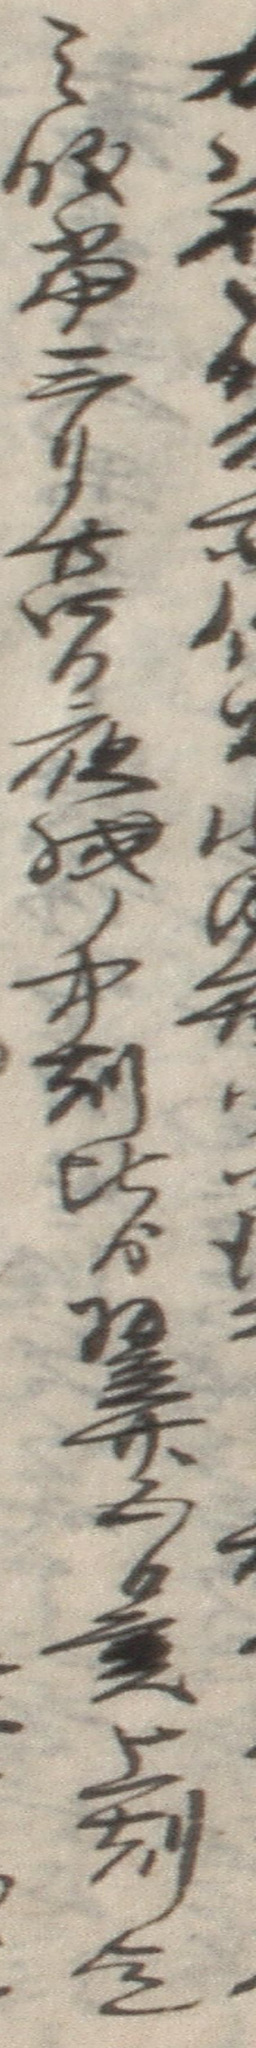之儀当三月廿四日夜戌之中刻比ゟ翌廿五日亥上刻迄
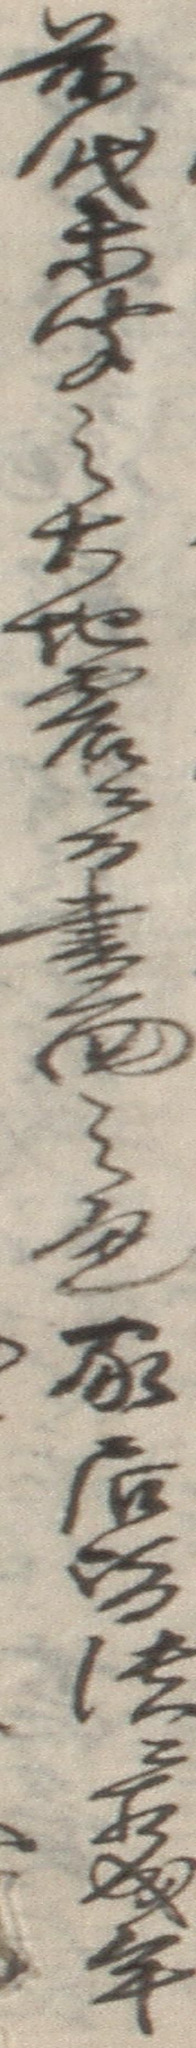前代未聞之大地震二而書面之通家居皆潰二相成牟
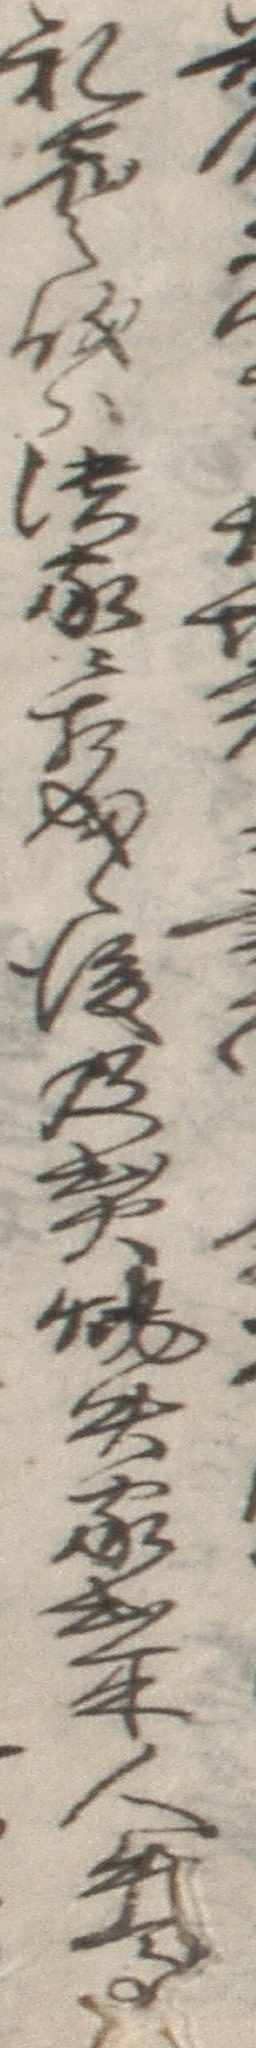礼宿之儀ハ潰家二相成候後及出火焼失家出来人牛馬
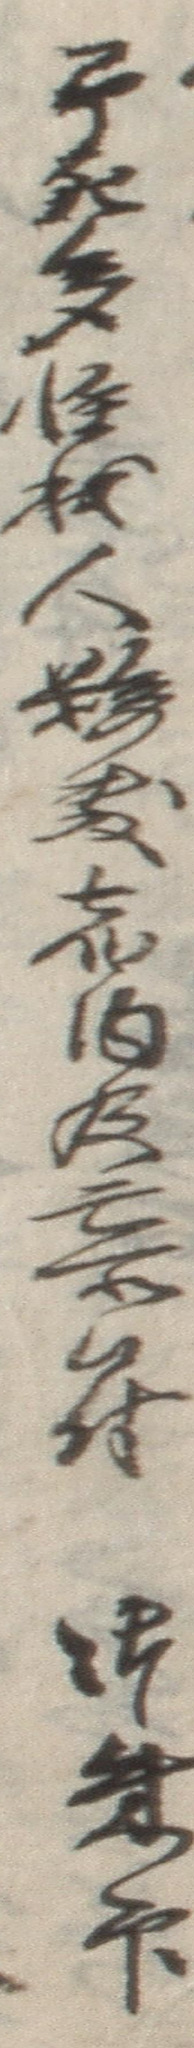即死多怪我人夥敷宿内及亡所候付御朱印
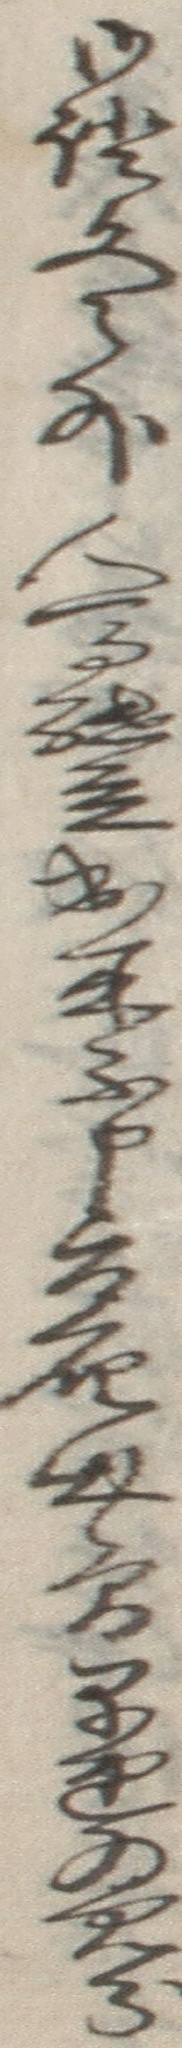御證文之外人馬継立出来不申旨届出候間早速為見分

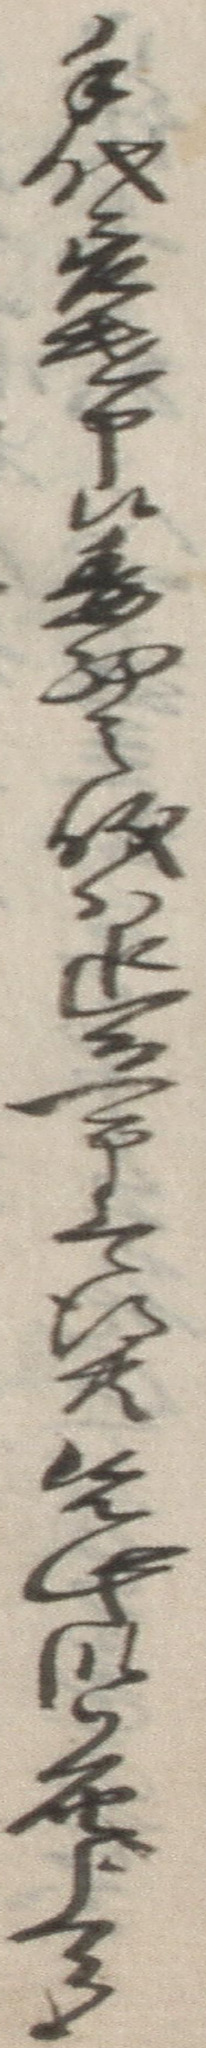手代差遣申候委細之儀ハ追而可申上候得共先此段御届申上候
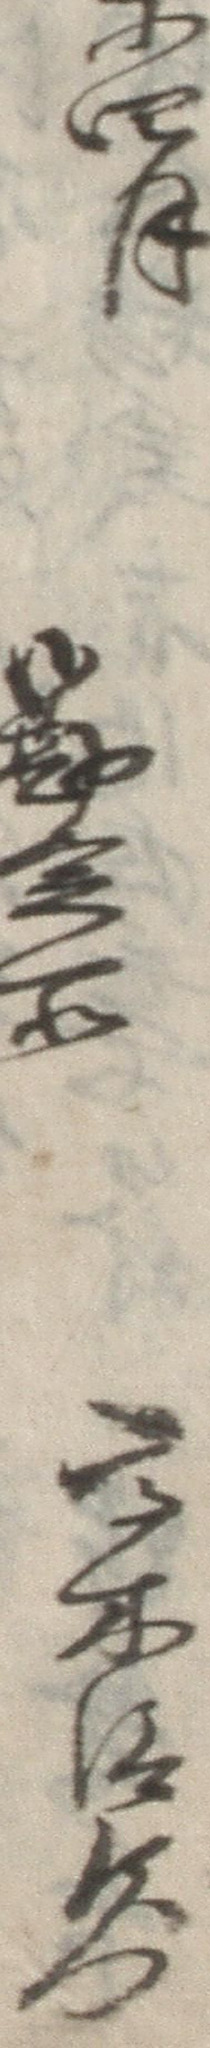未四月御勘定所高木清左衛門
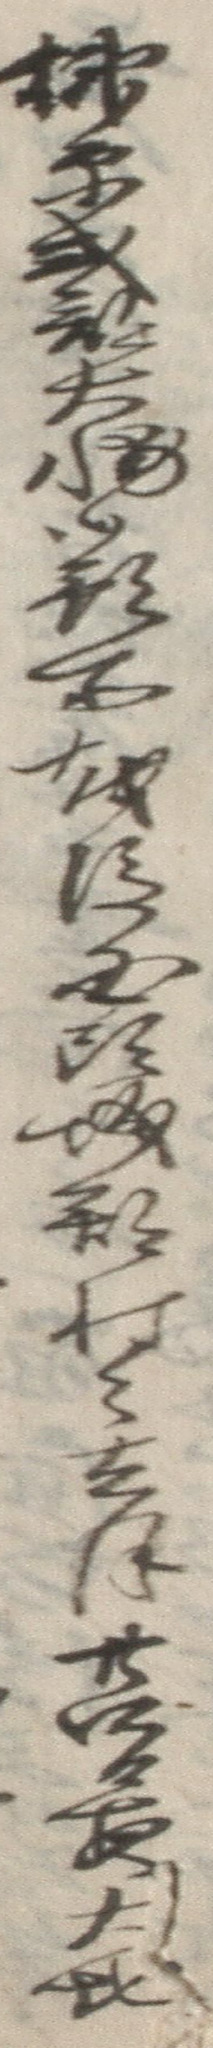榊原式部大輔御領所越後国頸城郡村々去月廿四日夜大地
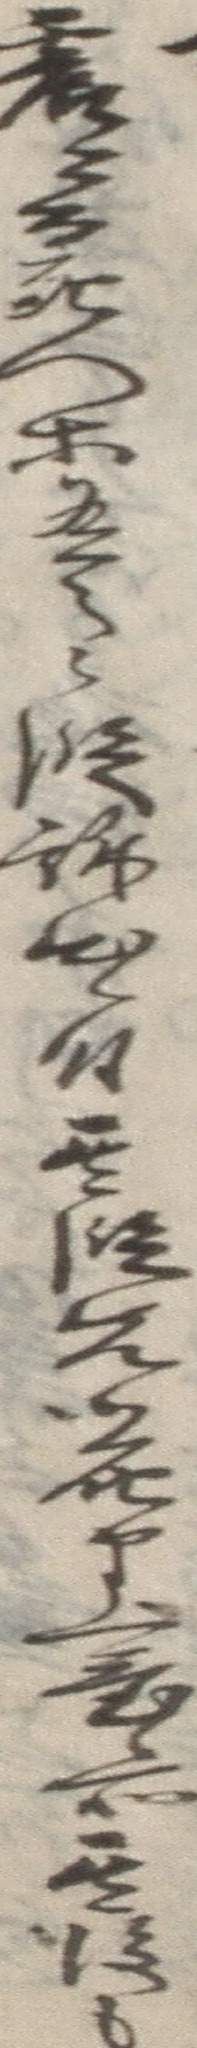震二而死人等有之候段訴出候付其段先御届申上置候所其後も
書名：信州地震一件
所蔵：東京大学地震研究所図書室 Earthquake Research Institute Library, The University of Tokyo, JAPAN
